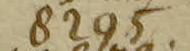8295
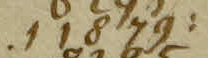11879
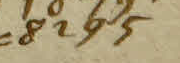8295
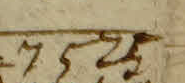7525
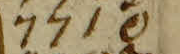7710
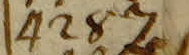4287
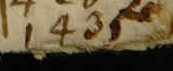1435
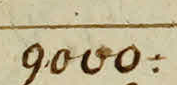9000
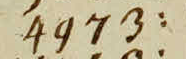4973
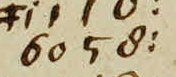6058
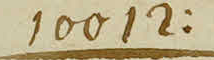10012
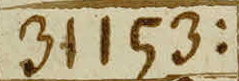31153
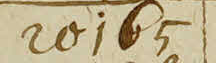20165
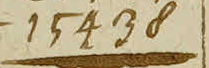15438
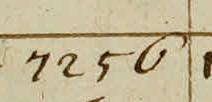7256
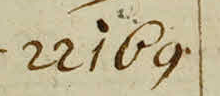22169
